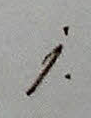1
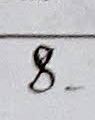8
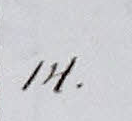14.
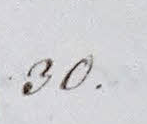30.
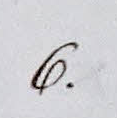6.
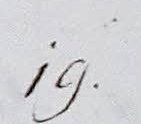19.
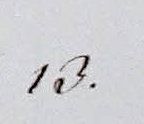13.
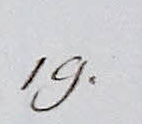19.
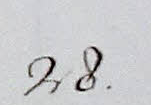28.
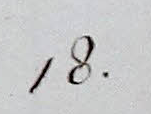18.
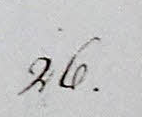26.
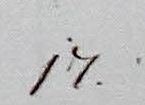17.
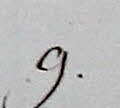9.
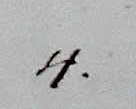4.
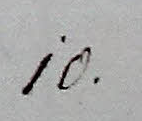10.
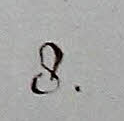8.
